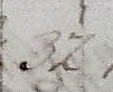32
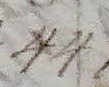44
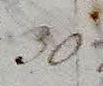30
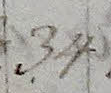34
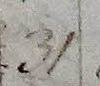31
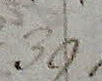39
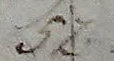52
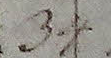34
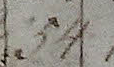54
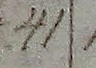41
